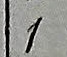1
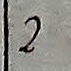2
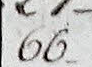66
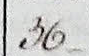36
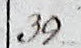39
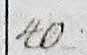40
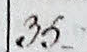35
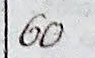60
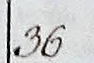36
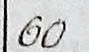60
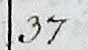37
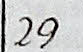29
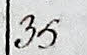35
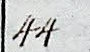44
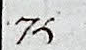75
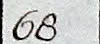68
